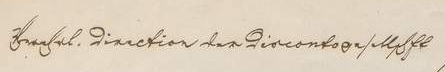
Verehrl. Direction der Discontogesellschft
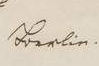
Berlin.
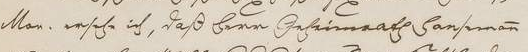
Mon. ersehe ich, daß Herr Geheimrath Hansemann
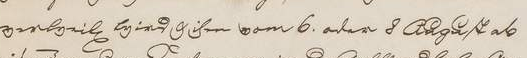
verweilen wird & ihm vom 6. oder 8 August ab
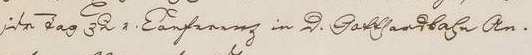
jdr Tag zu e. Conferenz in d. Gotthardbahn An-
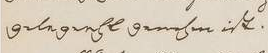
gelegenht genehm ist.
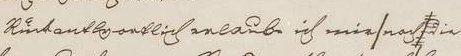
Rückantwortlich erlaube ich mir ||zu mr Orientirg.
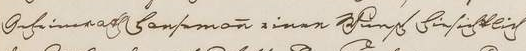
Geheimrath Hansemann einen Wunsch hinsichtlich
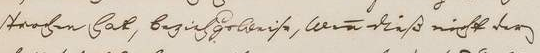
sprochen hat, beziehungsweise, wenn dieß nicht der
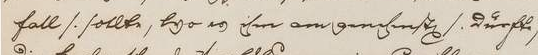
Fall s. sollte, wo es ihm am genehmsten s. dürfte,
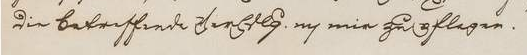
die betreffende Verhandlg. mit mir zu pflegen.
